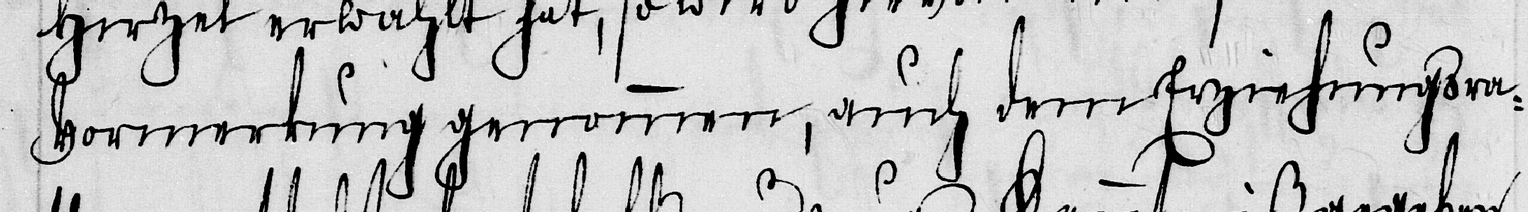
Vormerkung genommen, auch dem Erziehungsra¬
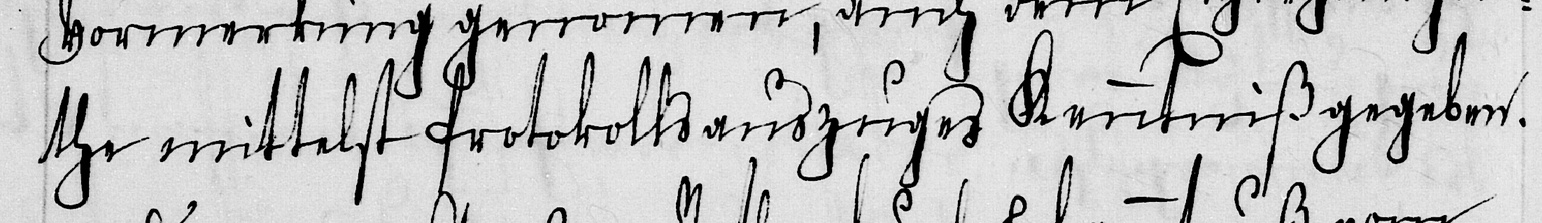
the mittelst Protokollsauszuges Kenntniß gegeben.
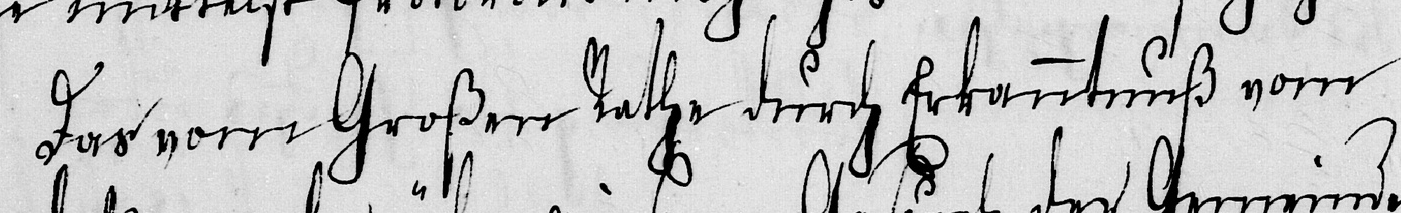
Das vom Großen Rathe durch Erkanntnuß vom
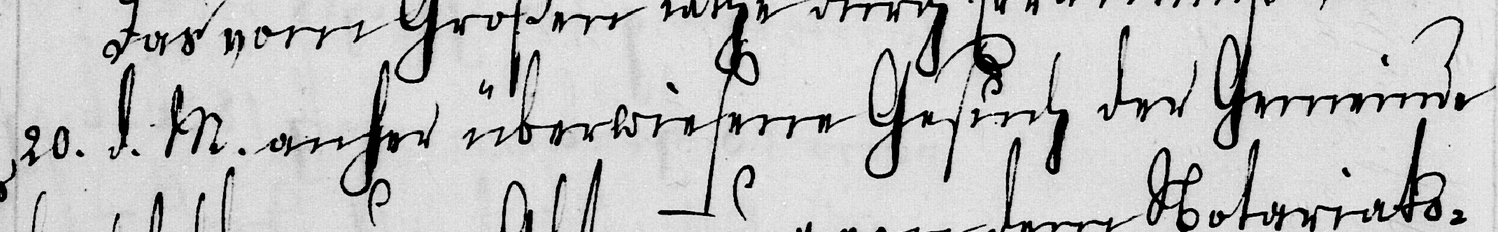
20. d. M. anher überwiesene Gesuch der Gemeinde
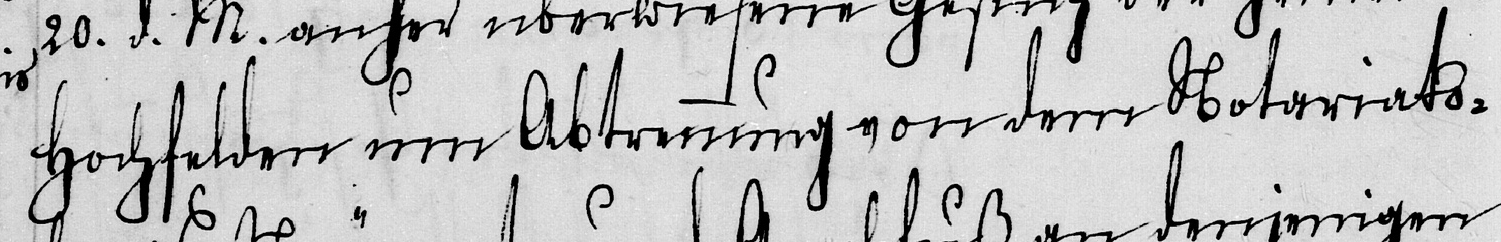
Hochfelden um Abtrennung von dem Notariats¬
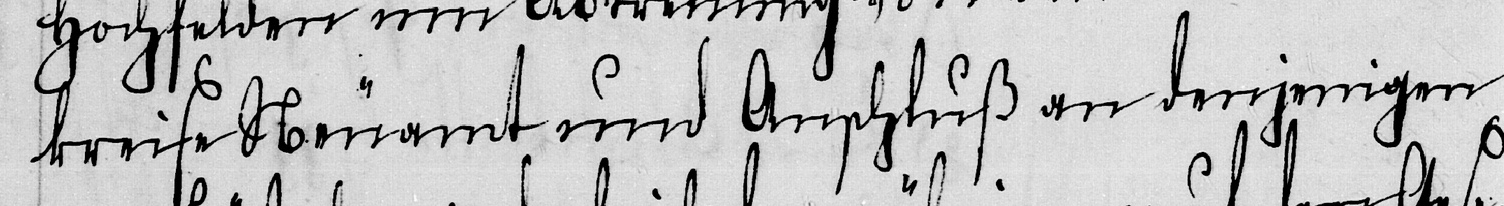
kreise Neuamt und Anschluß an denjenigen
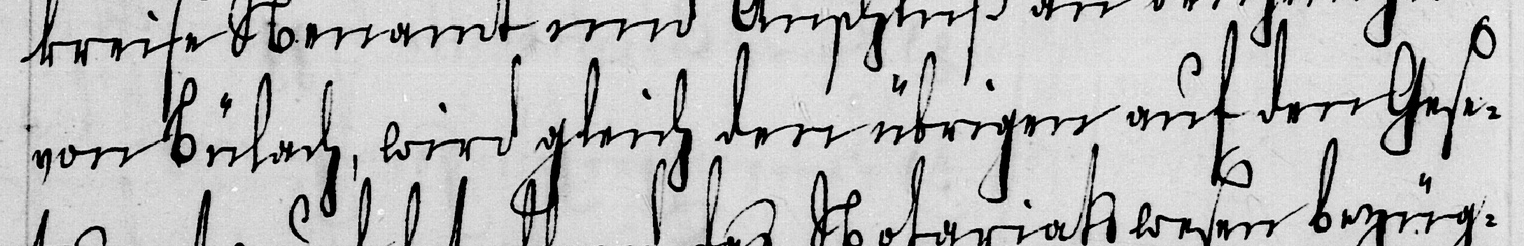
von Bülach, wird gleich den übrigen auf den Gese¬
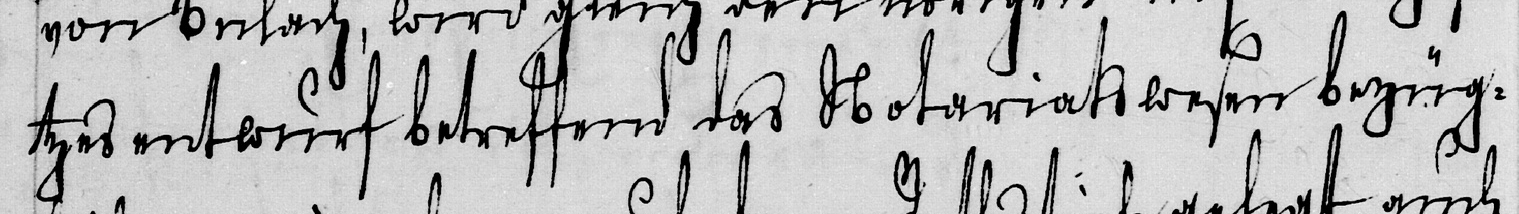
tzesentwurf betreffend das Notariatswesen bezüg¬
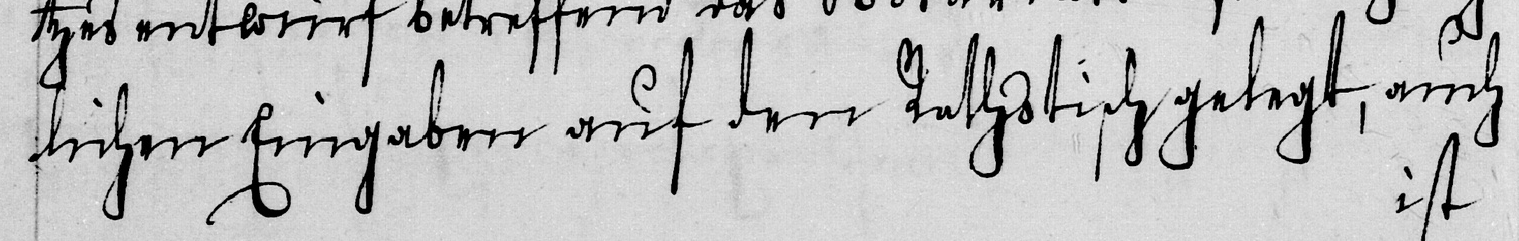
lichen Eingaben auf den Rathstisch gelegt, auch
